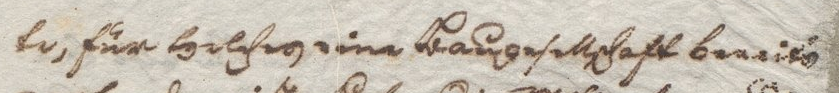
te, für welches eine Baugesellschaft bereits
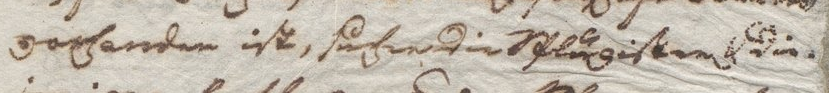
vorhanden ist, suchen die Splügisten & die-
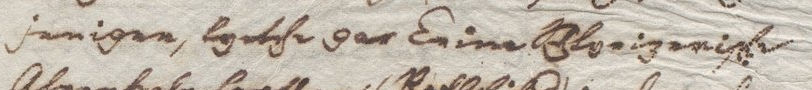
jenigen, welche gar keine Schweizerische
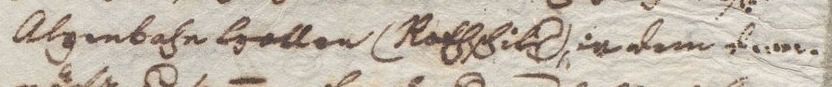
Alpenbahn wollen (Rothschild), in dem-
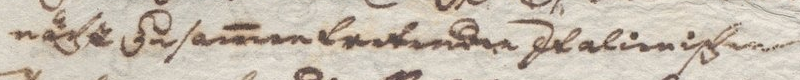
nächst zusammentretenden Italienischen
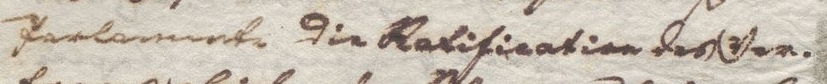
Parlamente die Ratification des Ver-
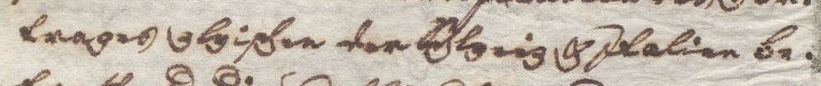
trages zwischen der Schweiz & Italien be-
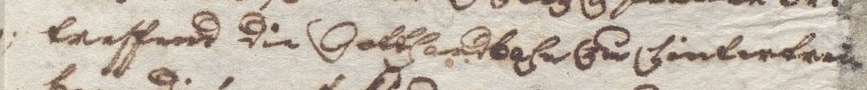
treffend die Gotthardbahn zu hintertrei-
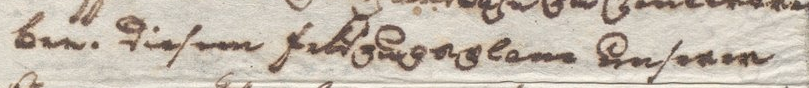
ben. Diesem Feldzugsplane unserer
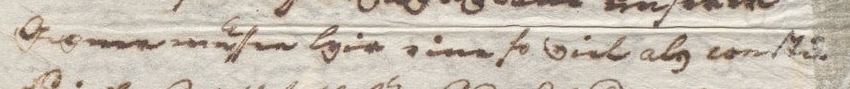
Gegner müssen wir eine so viel als consti-
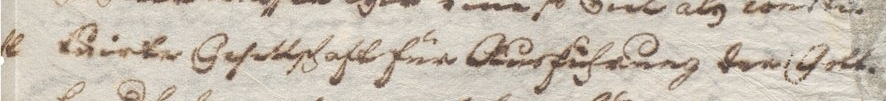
tuirte Gesellschaft für Ausführung der Gott-
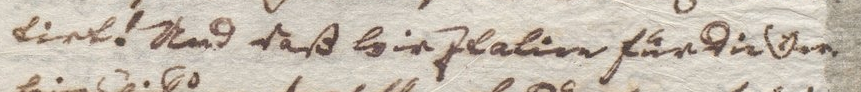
tirt! Und daß wir Italien für die Ver-
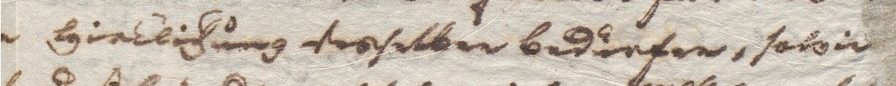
wirklichung desselben bedürfen, sowie
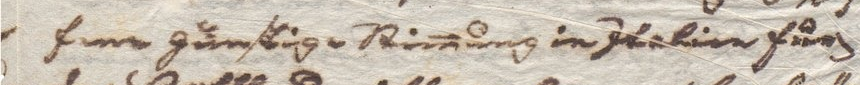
fene günstige Stimmung in Italien für
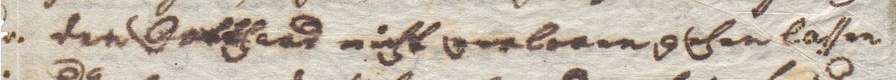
den Gotthard nicht verloren gehen lassen
